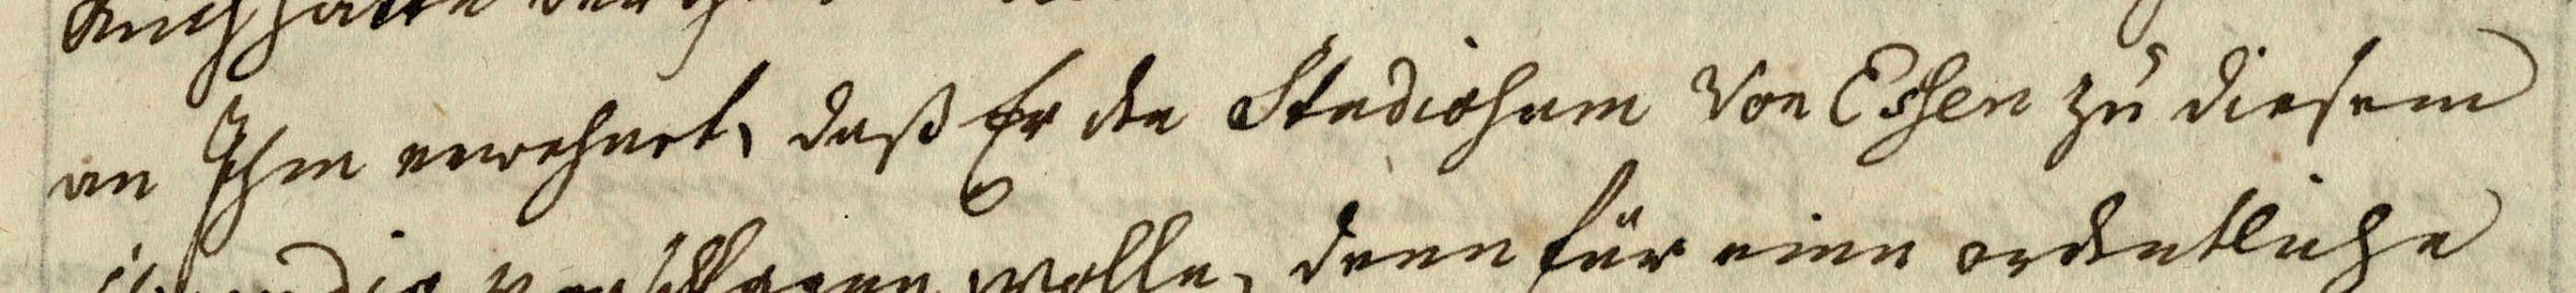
an Ihm erwehnet, daß Er den Studiosum von Essen zu diesem
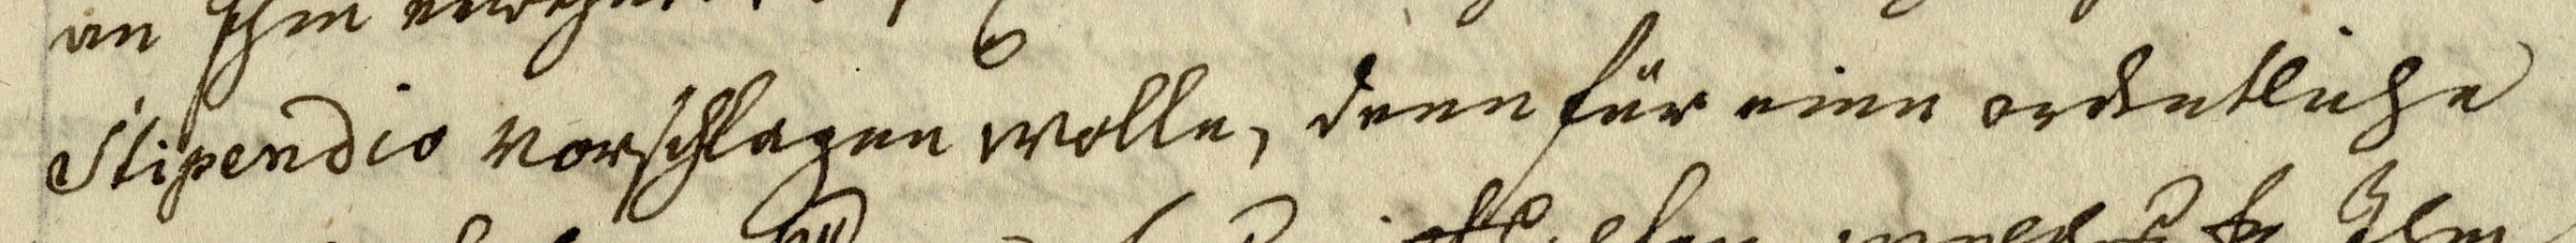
Stipendio vorschlagen wolle, denn für eine ordentliche
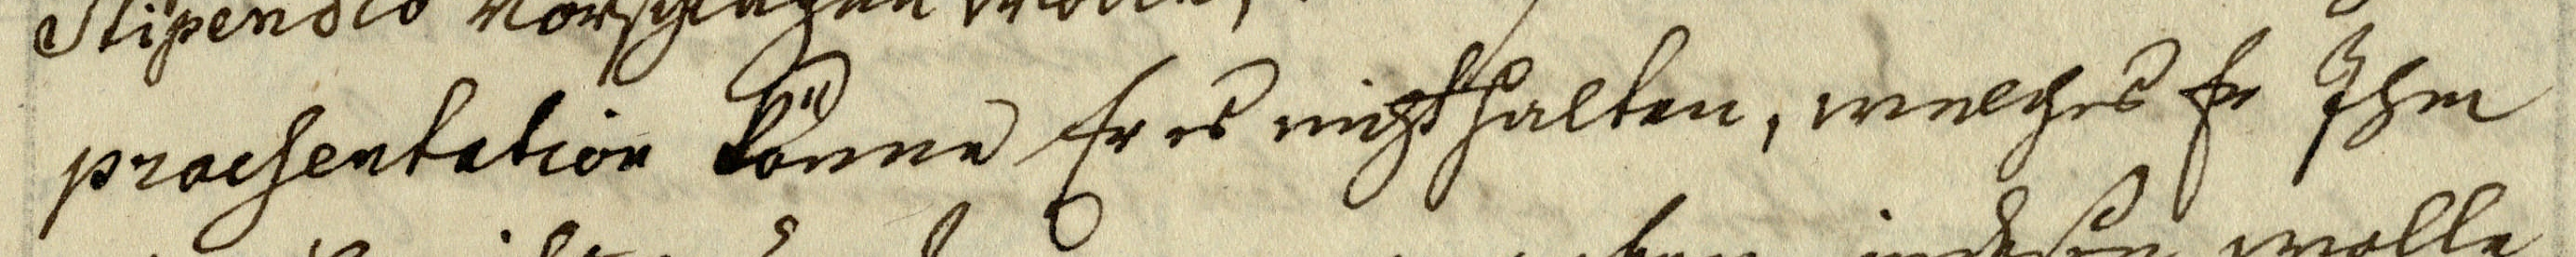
praesentation könne Er es nicht halten, welches Er Ihm
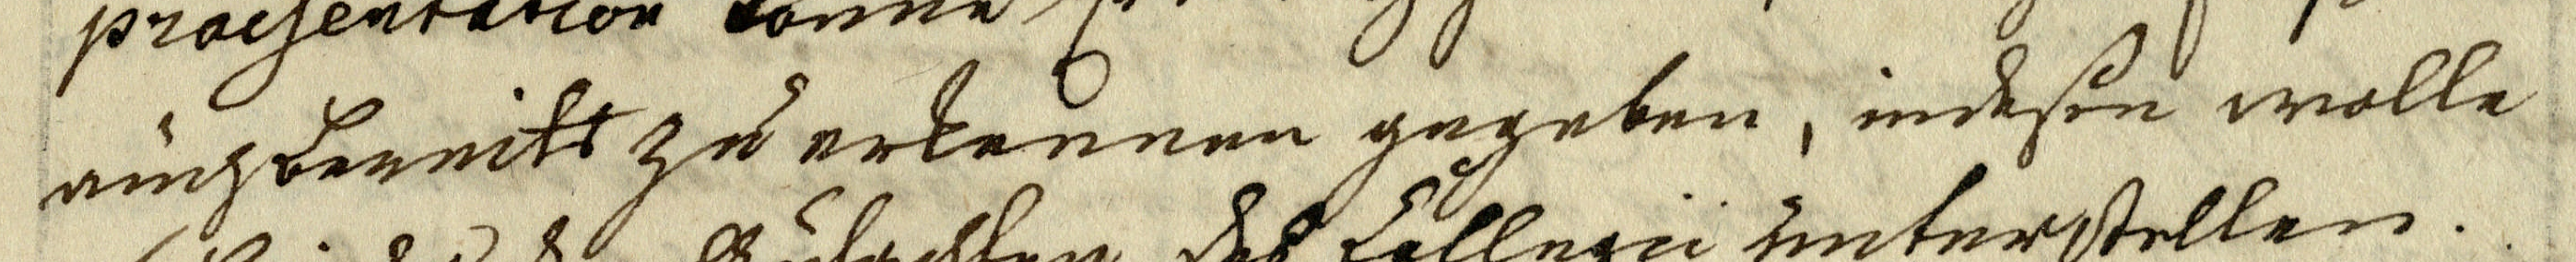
auch bereits zu erkennen gegeben, indeßen wolle
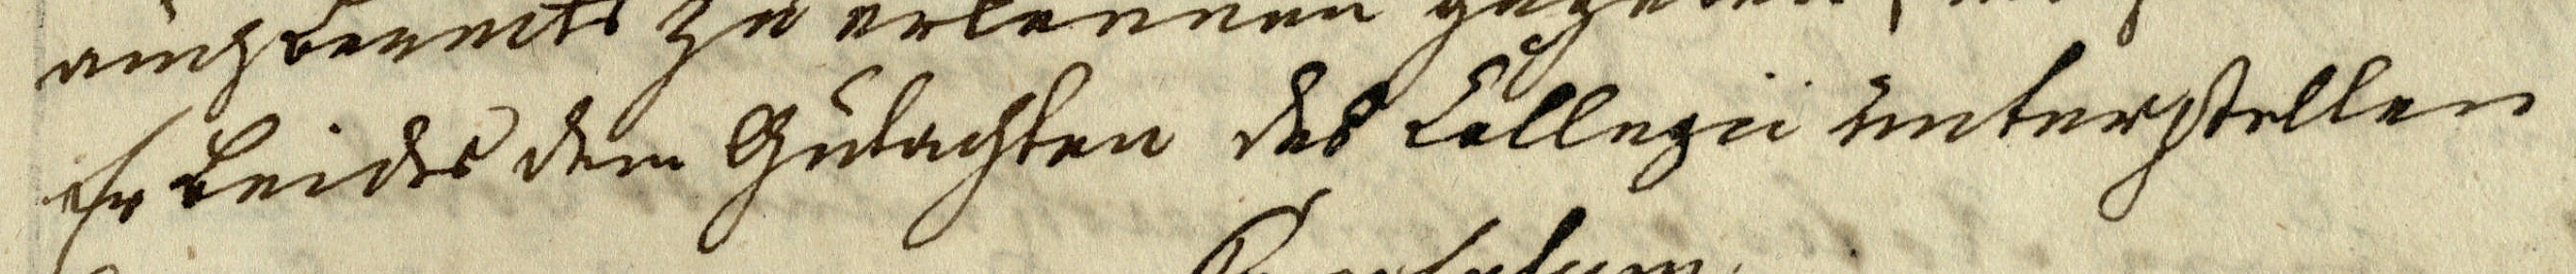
Er beides dem Gutachten des Collegii unterstellen.
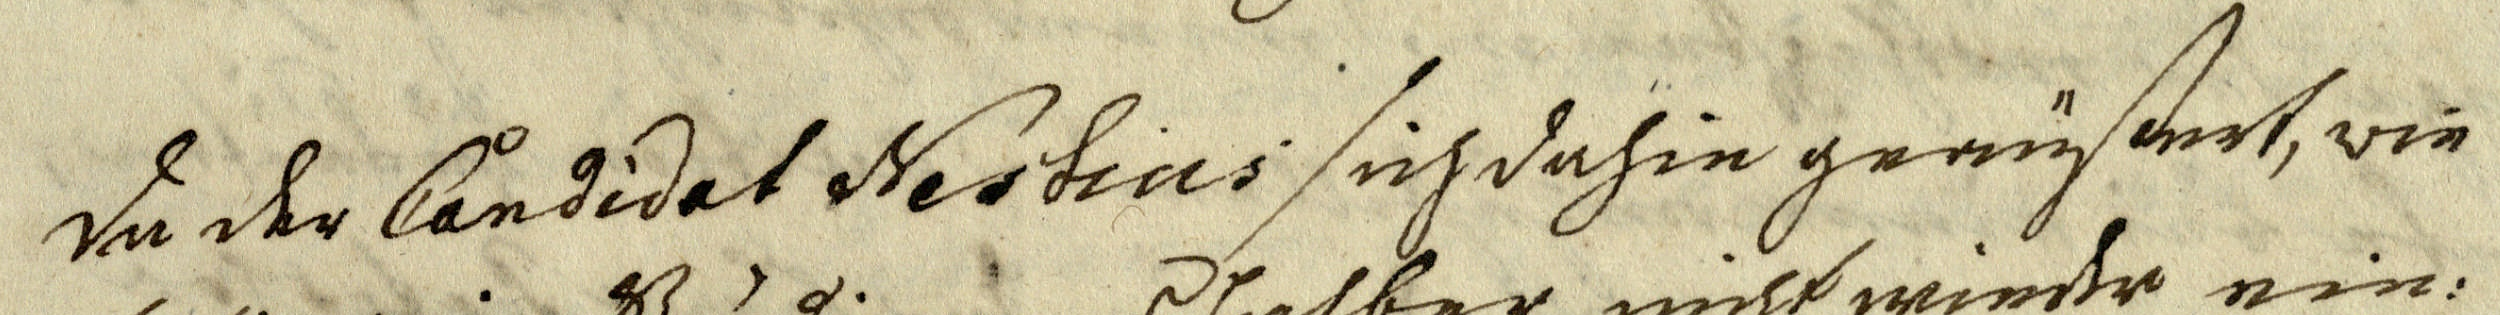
Da der Candidat Nestius sich dahin geäußert, wie
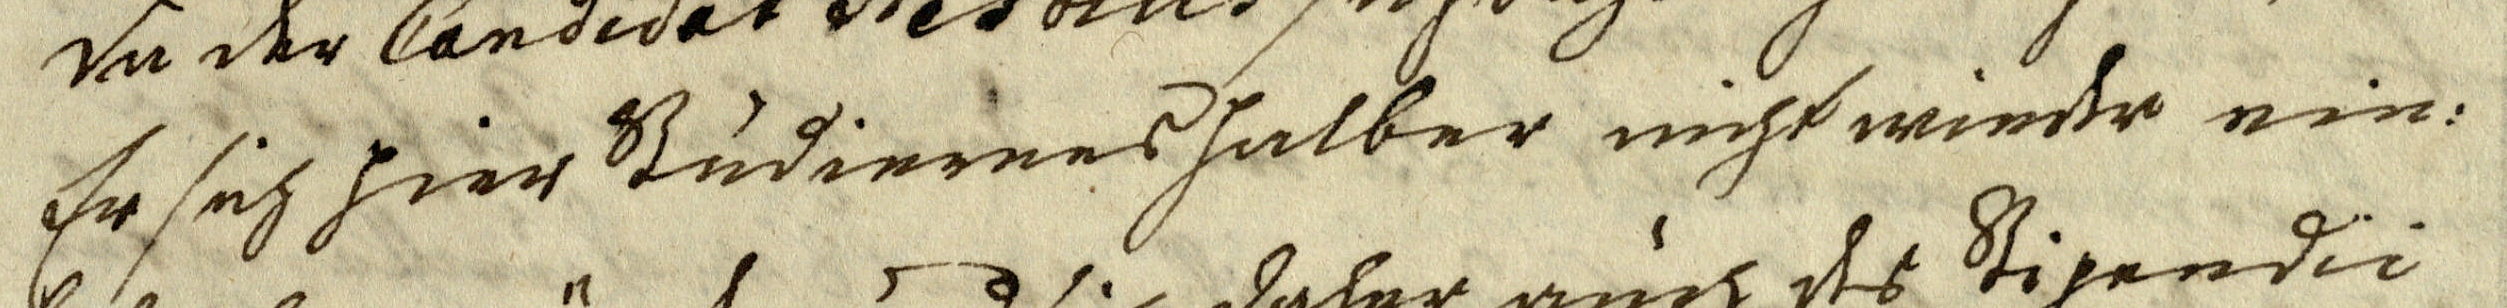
Er sich hier Studierens halber nicht wieder ein¬
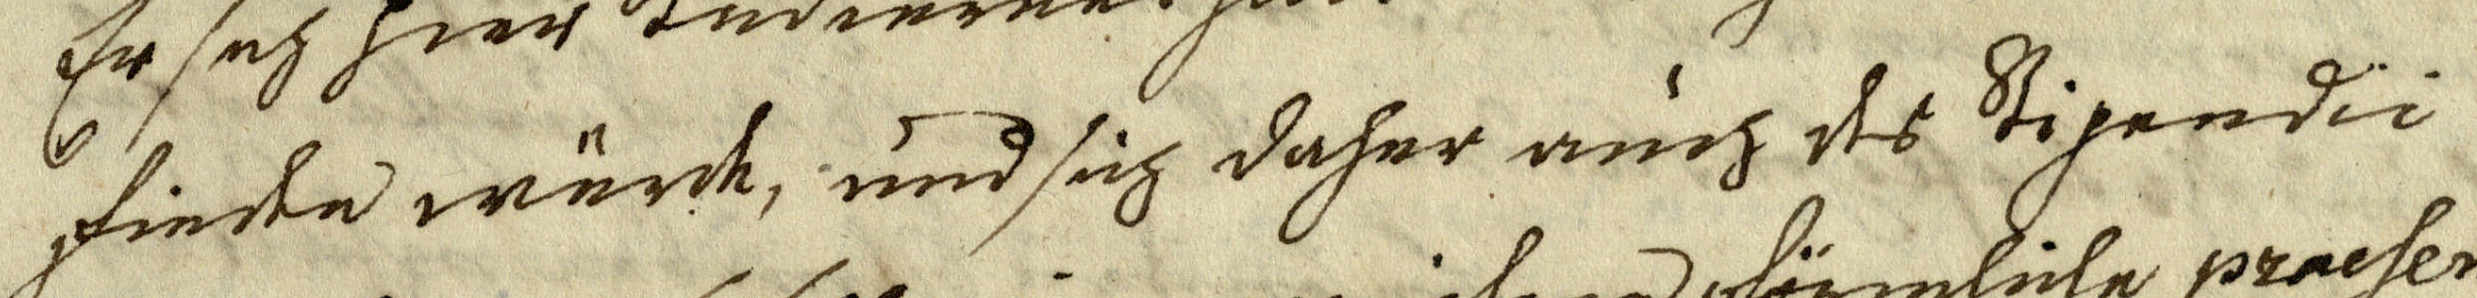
finden würde, und sich daher auch des Stipendii
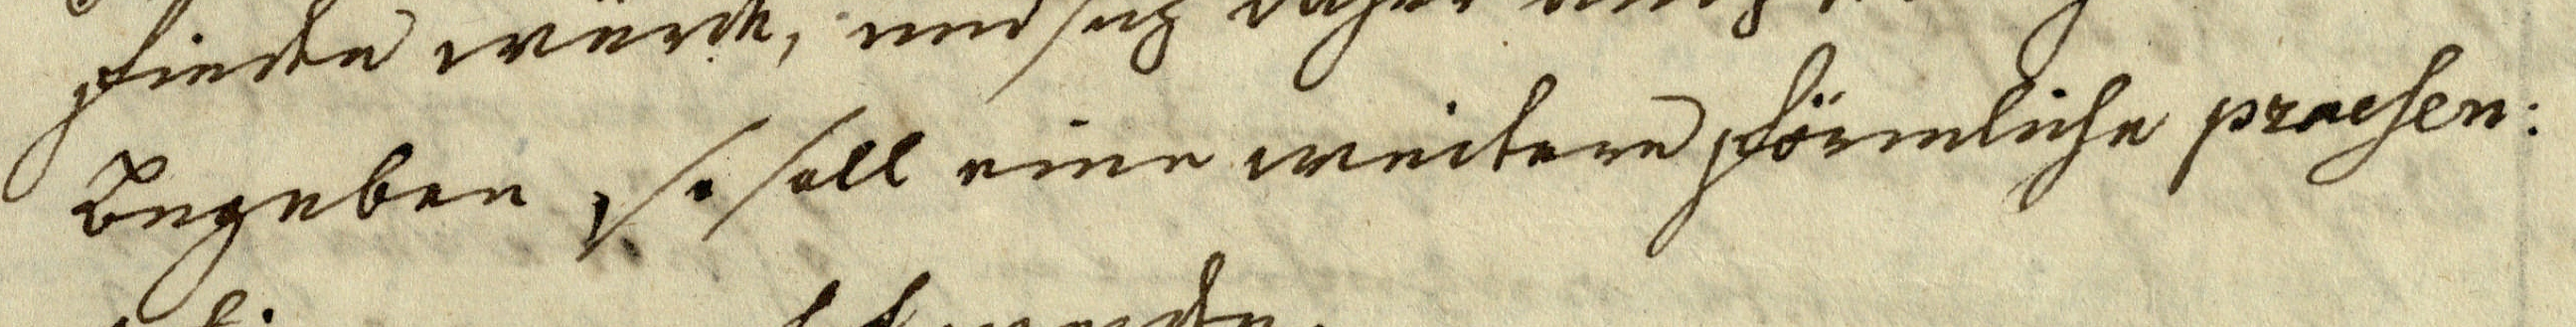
begeben so soll eine weitere förmliche praesen¬
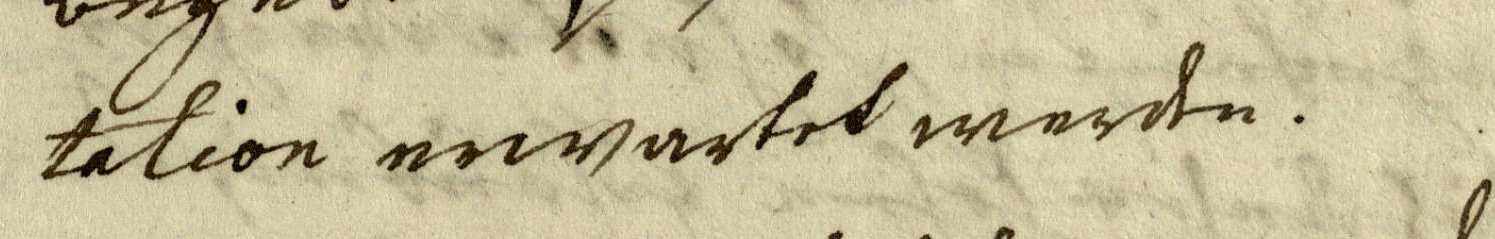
tation erwartet werden.
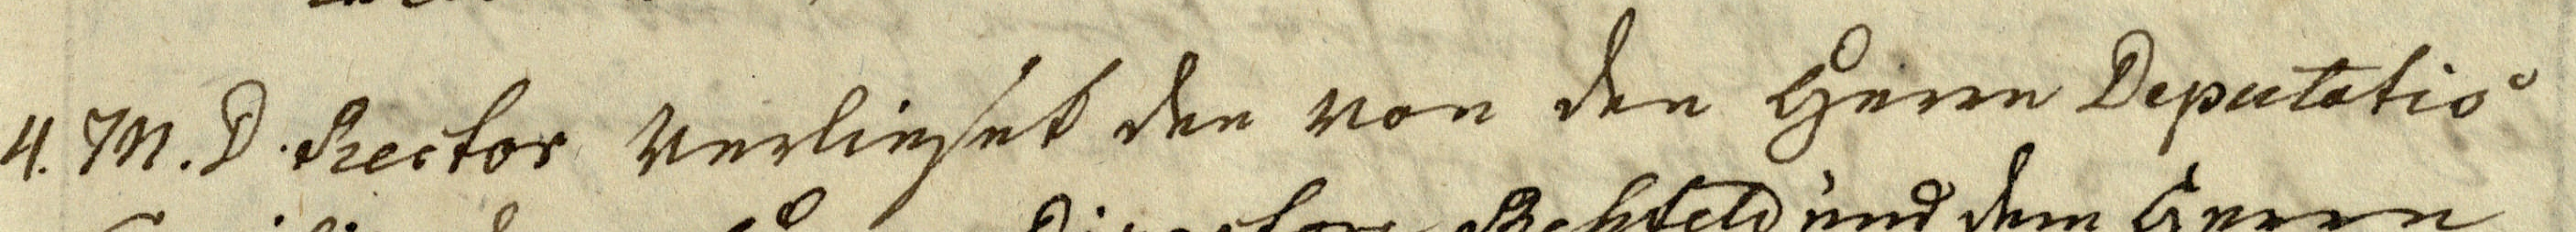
4. M. D. Rector verlieset den von den Herrn Deputatis
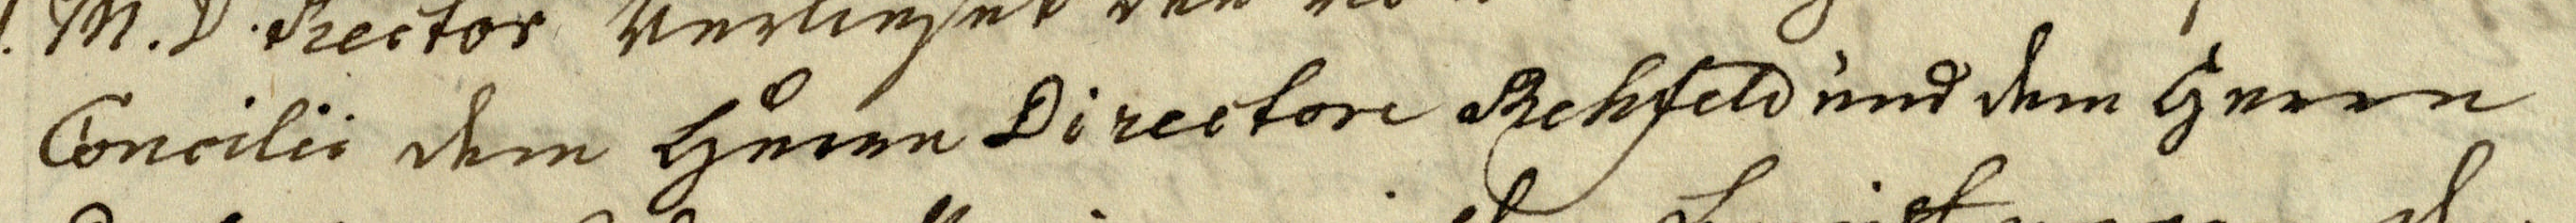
Concilii dem Herrn Director Rehfeld und dem Herrn
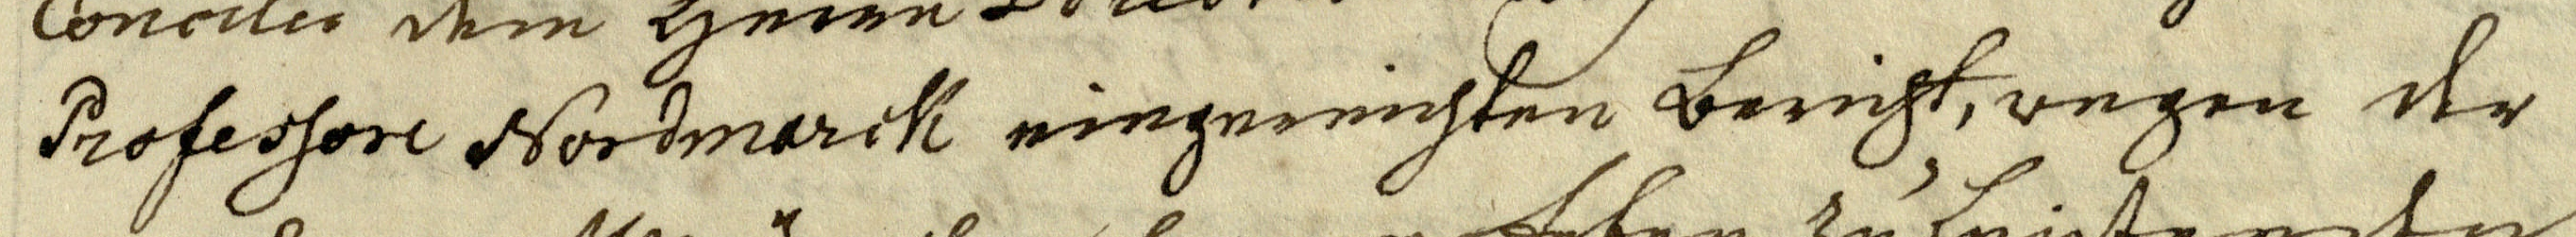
Professor Nordmarck eingereichten Bericht, wegen der
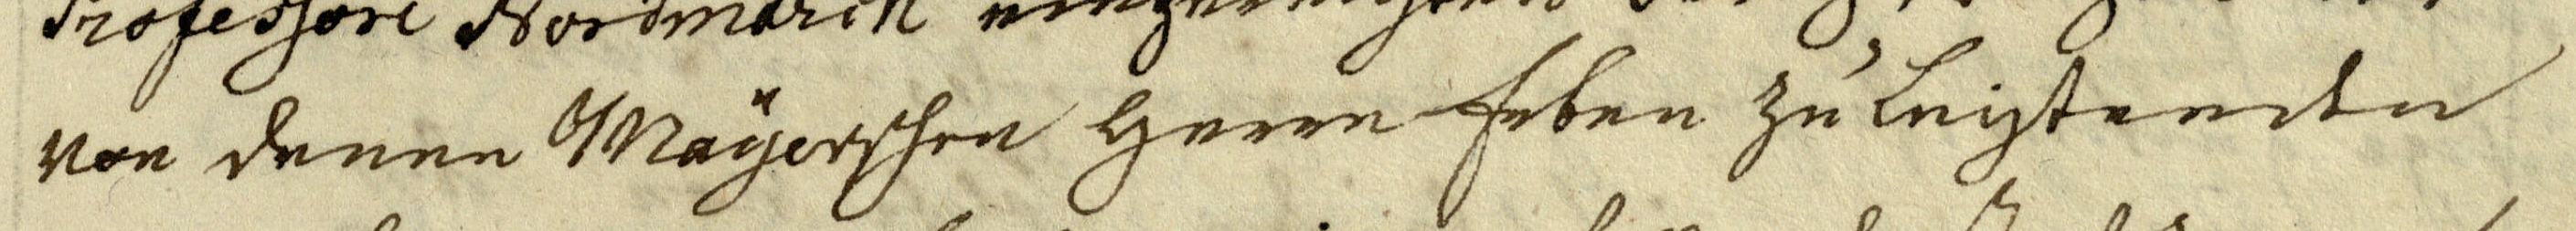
von denen Maÿerschen Herrn Erben zu leistenden
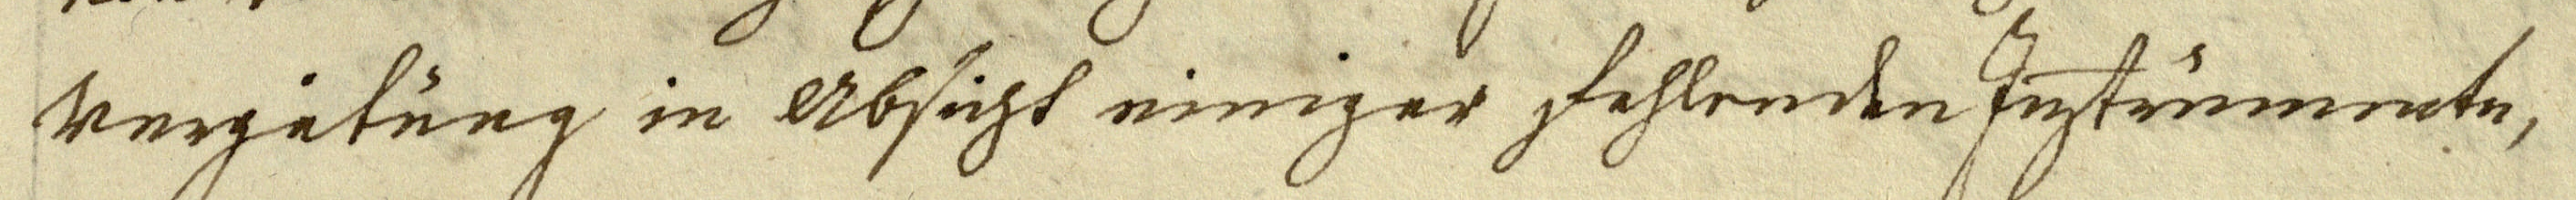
Vergütung in Absicht einiger fehlenden Instrumente,
